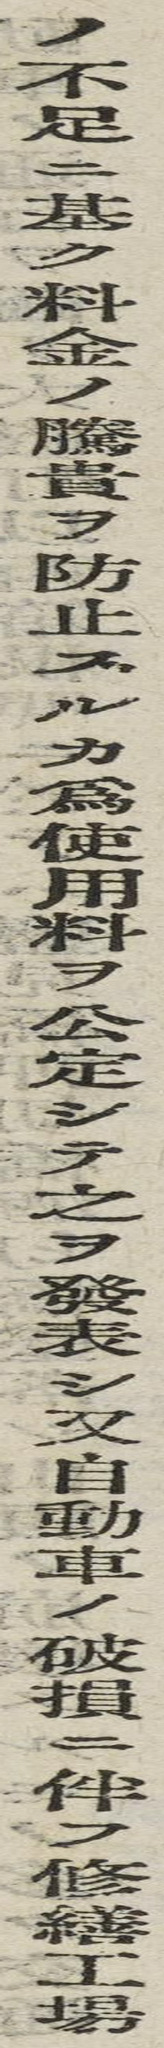ノ不足ニ基ク料金ノ騰貴ヲ防止スルカ為使用料ヲ公定シテ之ヲ発表シ又自動車ノ破損ニ伴フ修繕工場
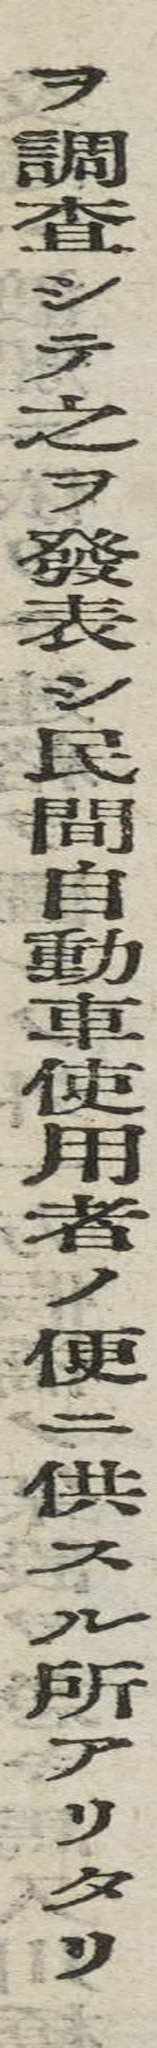ヲ調査シテ之ヲ発表シ民間自動車使用者ノ便ニ供スル所アリタリ
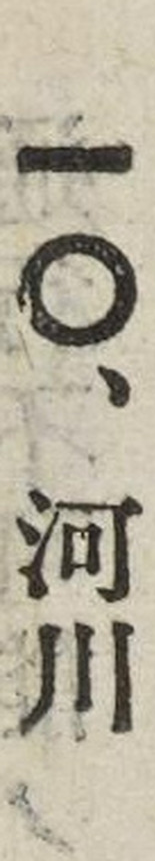一〇、河川
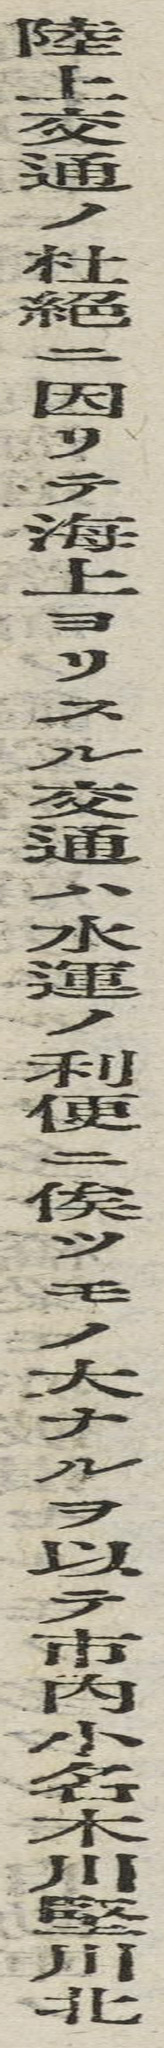陸上交通ノ杜絶ニ因リテ海上ヨリスル交通ハ水運ノ利便ニ俟ツモノ大ナルヲ以テ市内小名木川竪川北
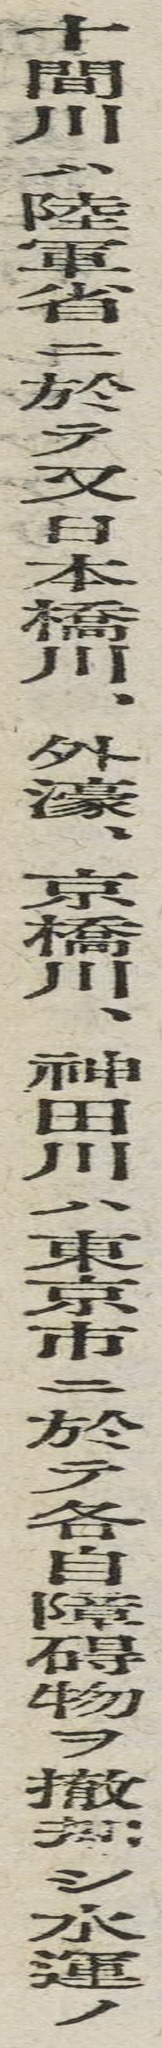十間川ハ陸軍省ニ於テ又日本橋川、外濠、京橋川、神田川ハ東京市ニ於テ各自障碍物ヲ撤去シ水運ノ
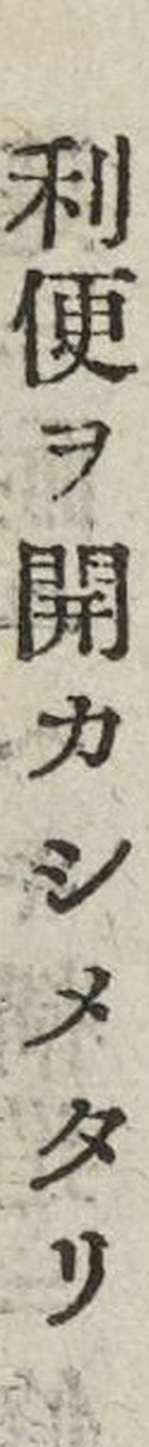利便ヲ開カシメタリ
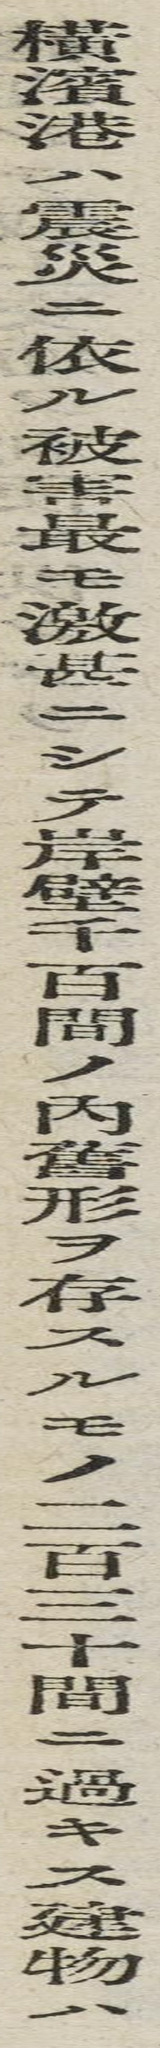横浜港ハ震災ニ依ル被害最モ激甚ニシテ岸壁千百間ノ内旧形ヲ存スルモノ二百三十間ニ過キス建物ハ
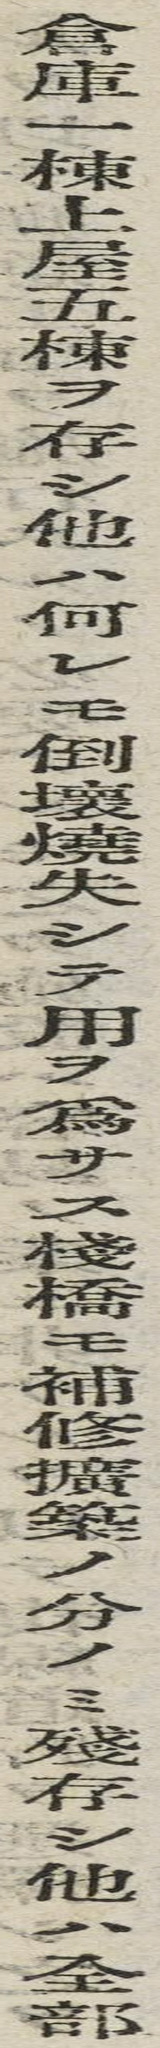倉庫一棟上屋五棟ヲ存シ他ハ何レモ倒壊焼失シテ用ヲ為サス桟橋モ補修拡築ノ分ノミ残存シ他ハ全部
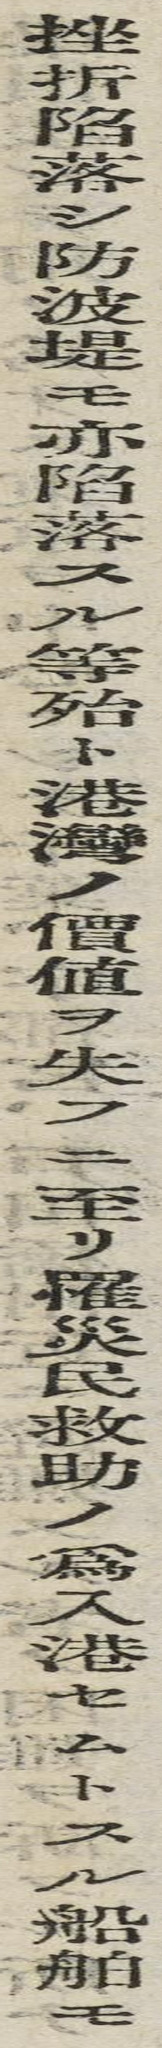挫折陥落シ防波堤モ亦陥落スル等殆ト港湾ノ価値ヲ失フニ至リ罹災民救助ノ為入港セムトスル船舶モ
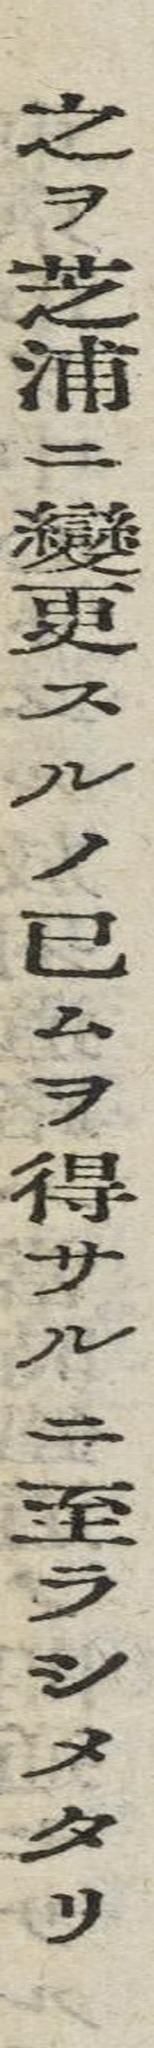之ヲ芝浦ニ変更スルノ已ムヲ得サルニ至ラシメタリ
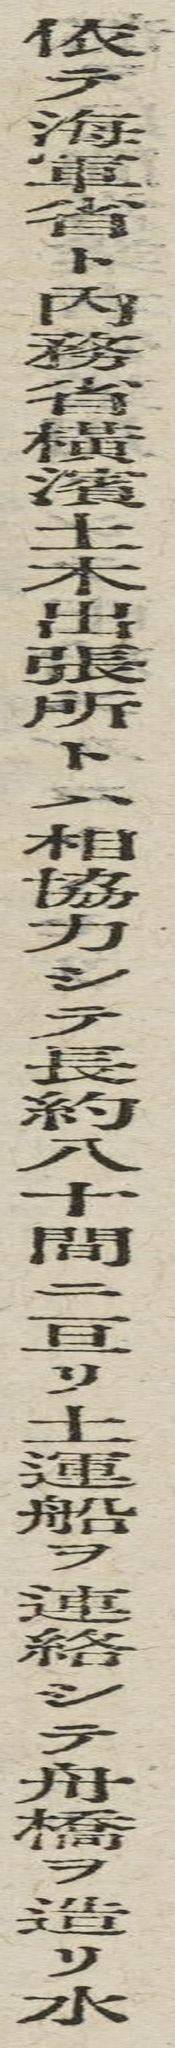依テ海軍省ト内務省横浜土木出張所トハ相協力シテ長約八十間ニ亘リ土運船ヲ連絡シテ舟橋ヲ造リ水
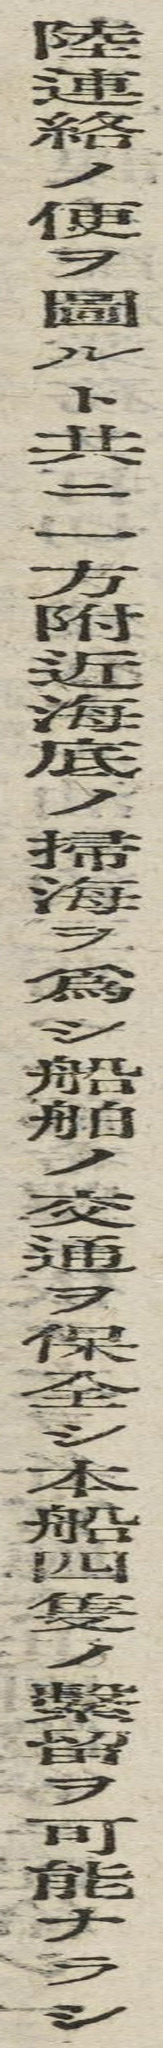陸連絡ノ便ヲ図ルト共ニ一方附近海底ノ掃海ヲ為シ船舶ノ交通ヲ保全シ本船四隻ノ繋留ヲ可能ナラシ
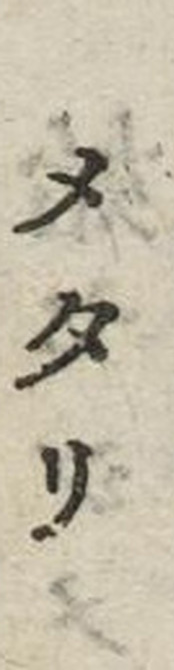メタリ
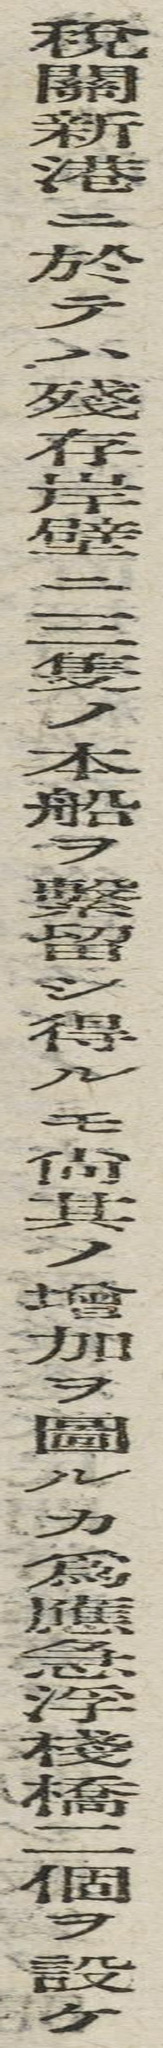税関新港ニ於テハ残存岸壁ニ三隻ノ本船ヲ繋留シ得ルモ尚其ノ増加ヲ図ルカ為応急浮桟橋二個ヲ設ケ
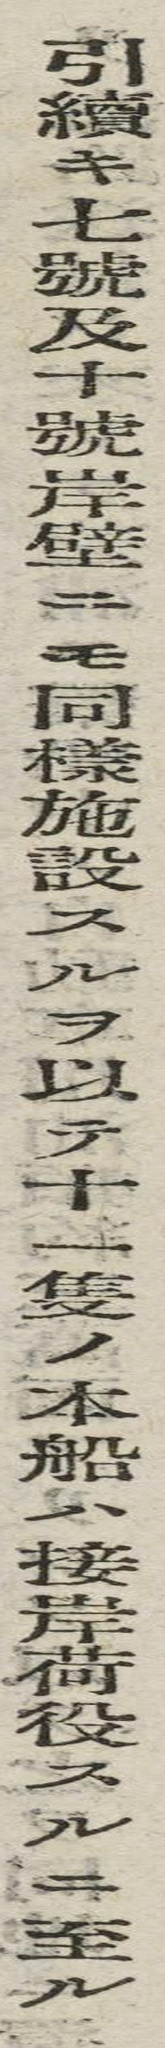引続キ七号及十号岸壁ニモ同様施設スルヲ以テ十一隻ノ本船ハ接岸荷役スルニ至ル
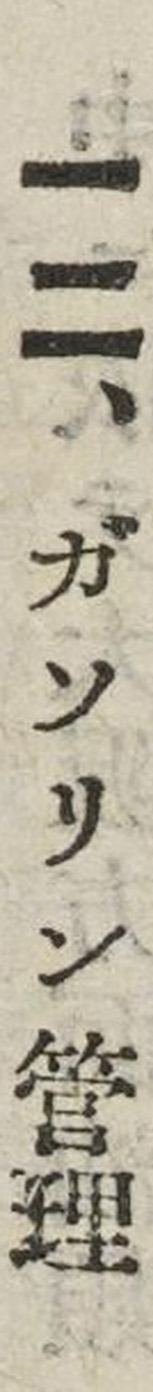一二、ガソリン管理
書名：震災被害状況並救護施設概要
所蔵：東京大学地震研究所図書室 Earthquake Research Institute Library, The University of Tokyo, JAPAN
